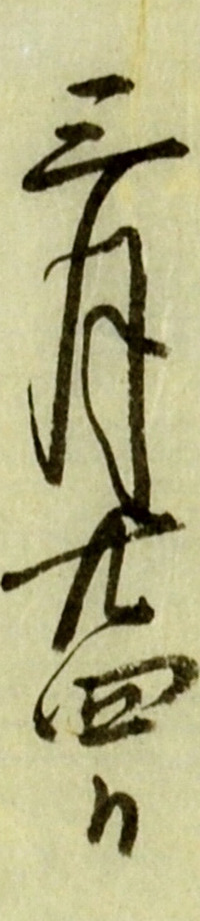三月廿四日
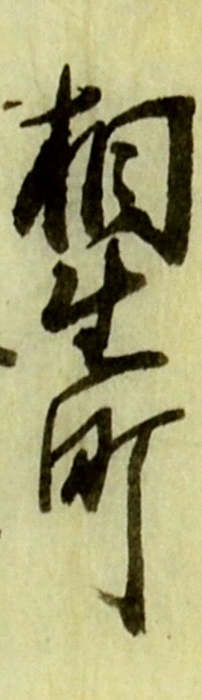相生町
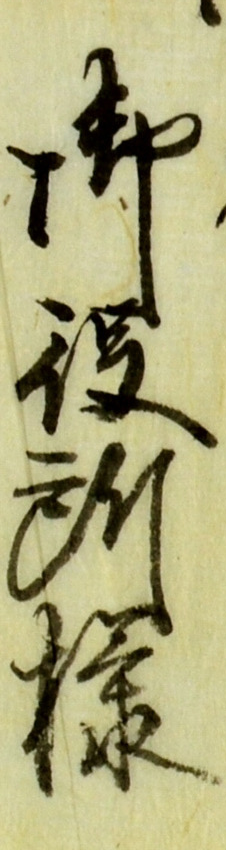御役所様
